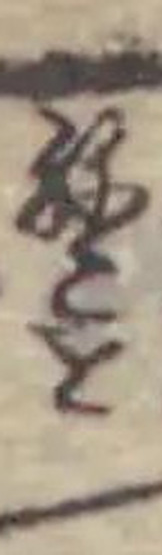ねこを
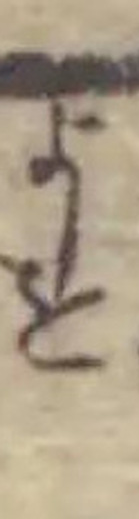よしを
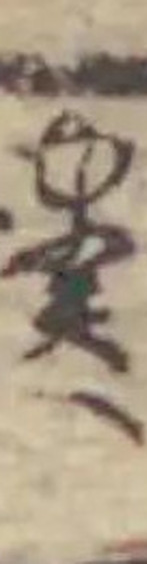ゆふ天へ
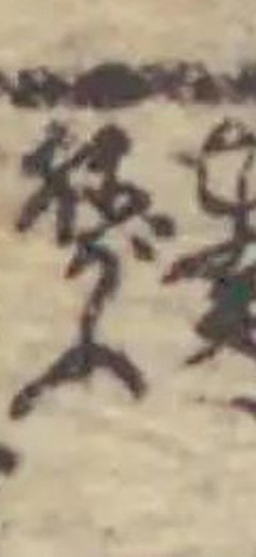ねがふ
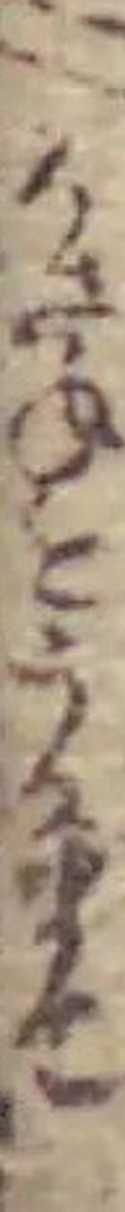かさねをうかませ
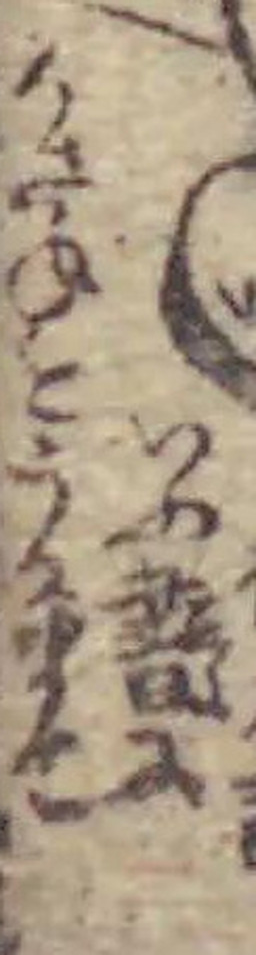かさねをうかませ
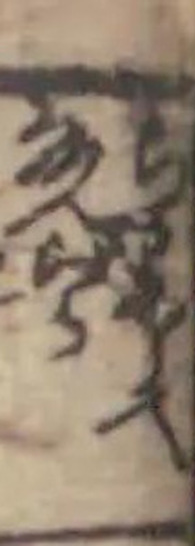なんぢら
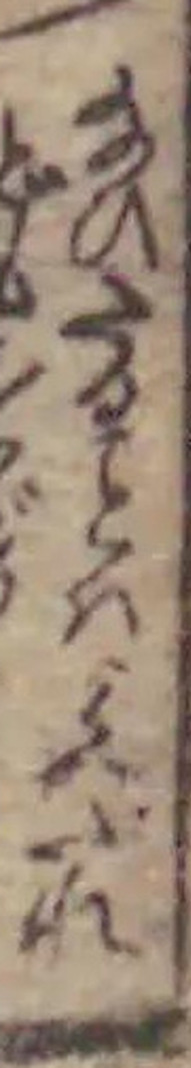給ひたることはみへたれ
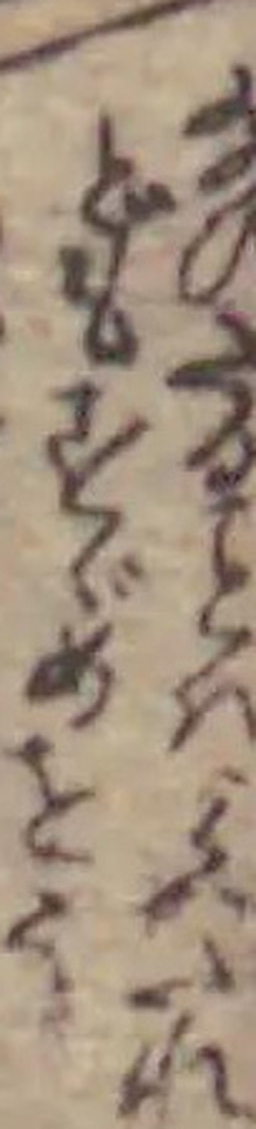どもすゞめをう
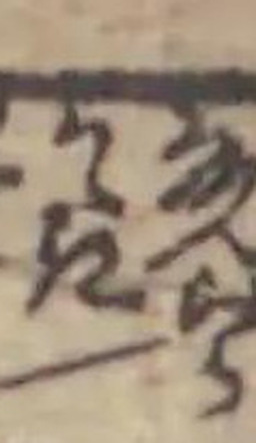かたき
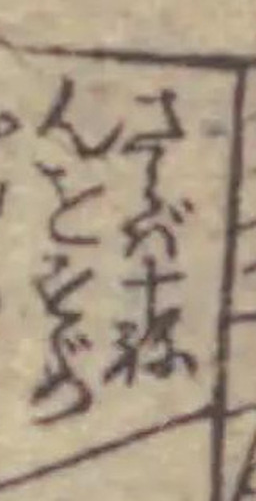さらば十ね
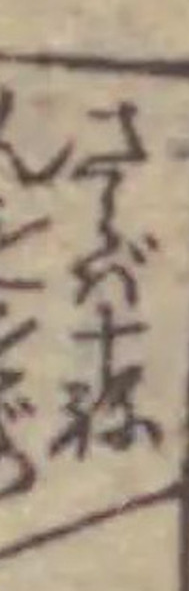さらば十ね
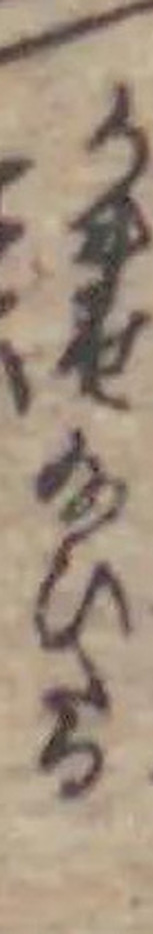かませ給ひたる
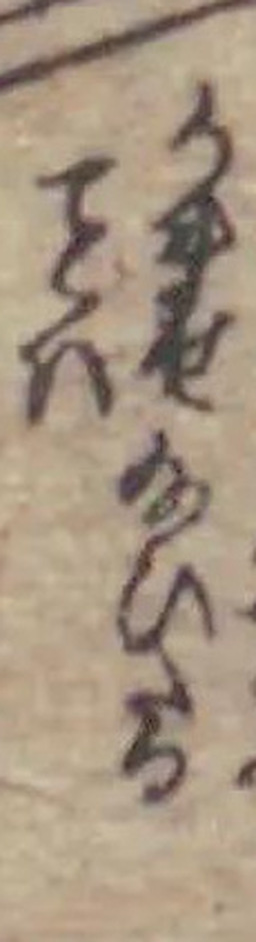ことは
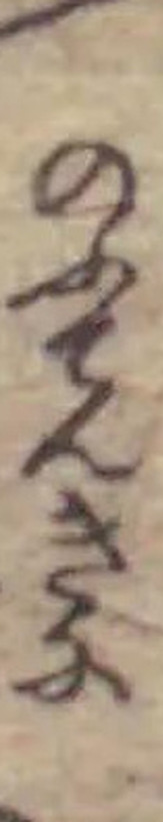のふてんきに
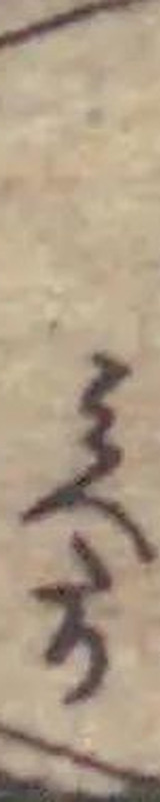みへたり
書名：冷水灰毛猫 2巻
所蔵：国立国会図書館 National Diet Library, JAPAN
